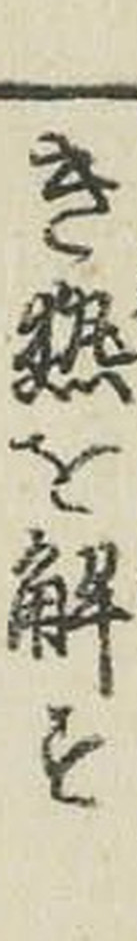き熱を解す
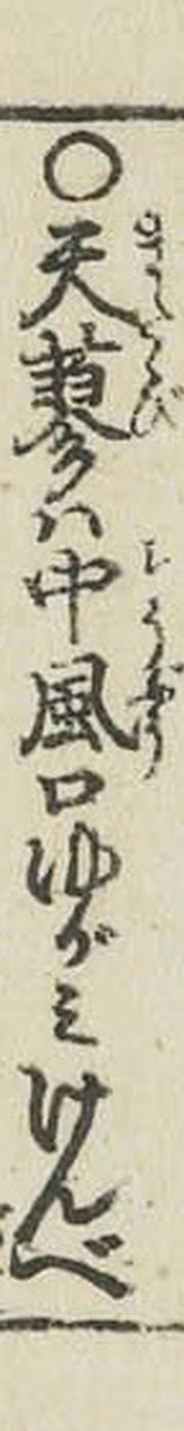○天蓼は中風口ゆがみけんべ
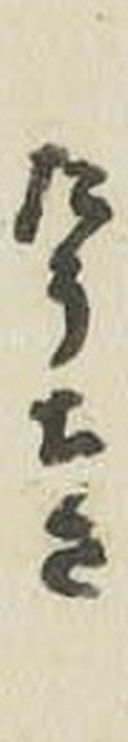たうちさ
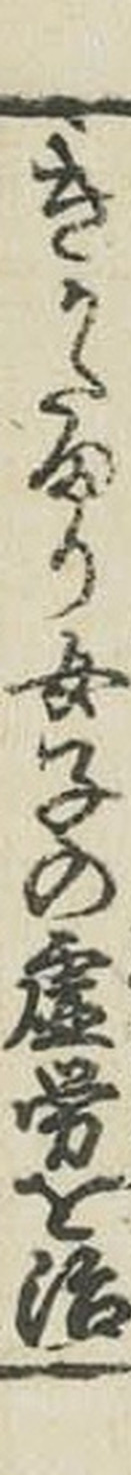きかたまり女子の虚労を治
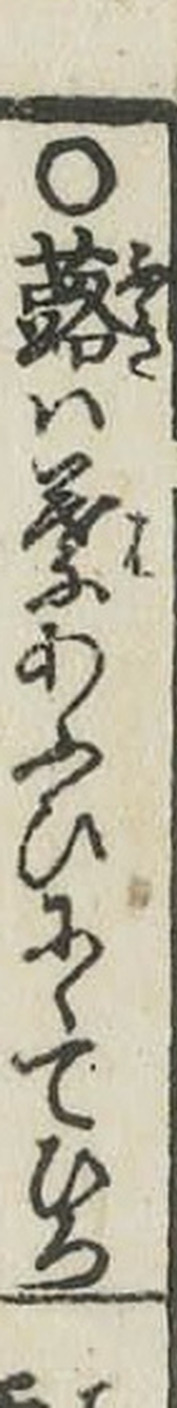○蕗は葉あふひにゝてひろ
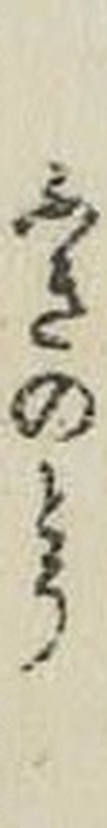ふきのとう
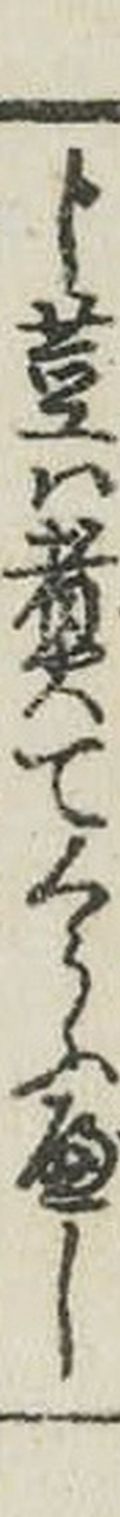じ茎は煮てくらふべし
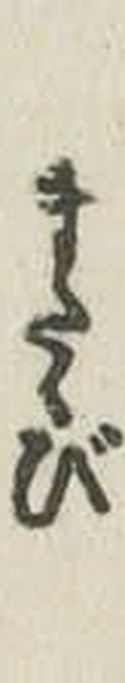またゝび
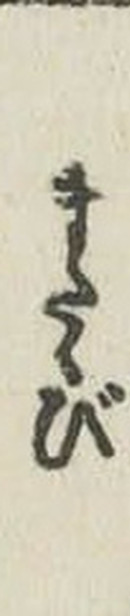またゝび
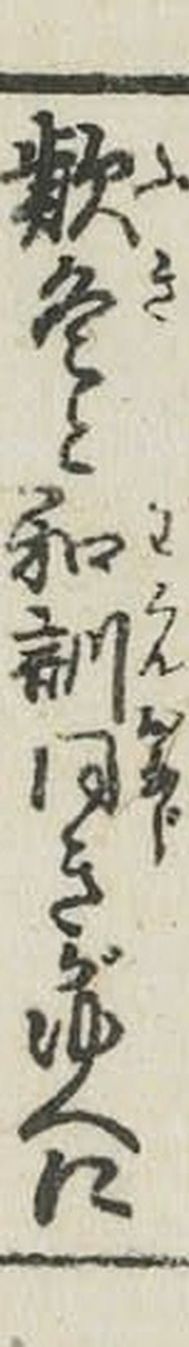款冬と和訓同きがゆへに
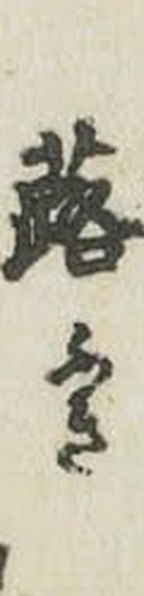蕗ふき
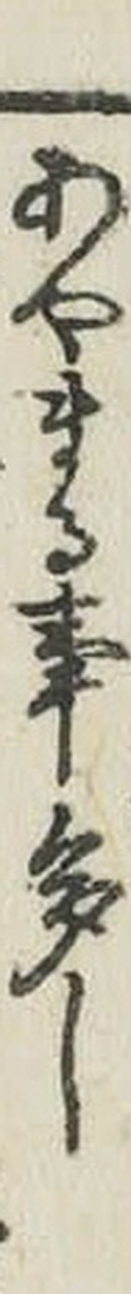あやまる事多し
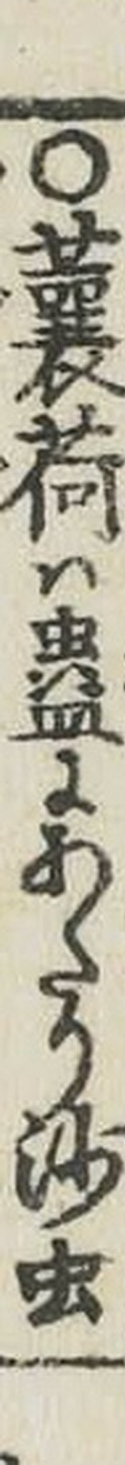○蘘荷は蠱にあたり沙虫
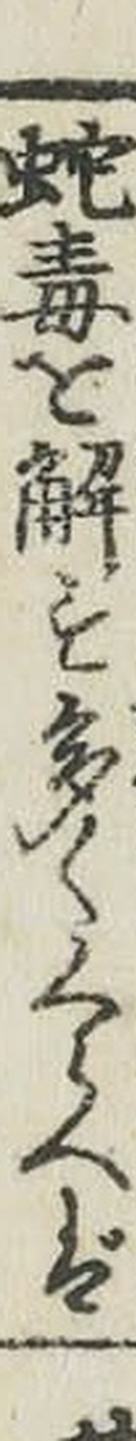蛇毒を解す多くくらへば
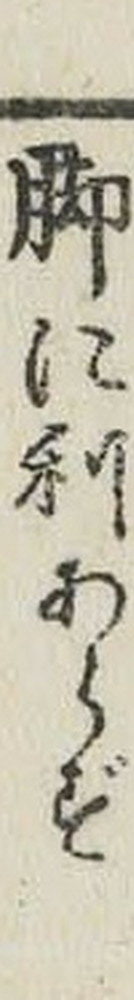脚に利あらず
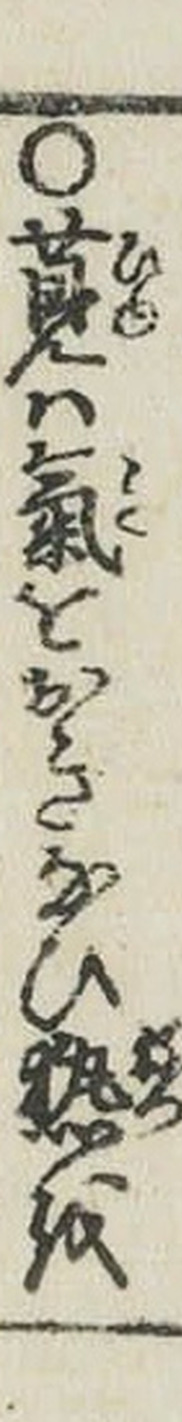○莧は気をおきなひ熱を
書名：増補頭書訓蒙図彙大成 10巻 8:巻之17-19
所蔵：東京学芸大学教育コンテンツアーカイブ
